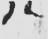八
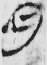月
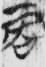丙
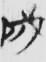戌
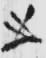之
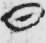日
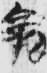○（宰）
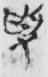受
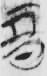○（期）
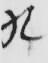九
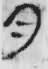月
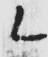乙
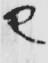巳
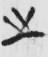之
